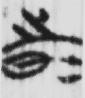之日
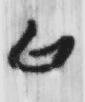㠯（以）
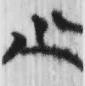少
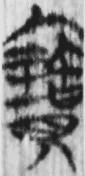寶
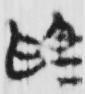爲
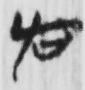左
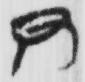尹
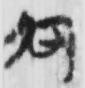卲
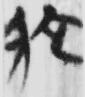{力它}
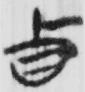貞
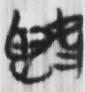既
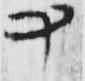又（有）
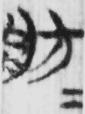病病
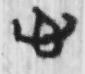心
